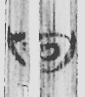昌
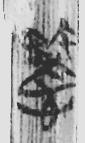{竹惪}
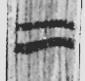二
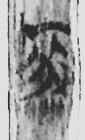{戶攴}（啟）
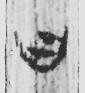曰
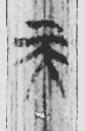天
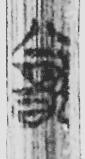猶
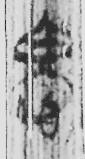畏
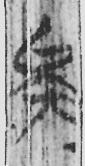矣
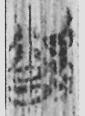豫
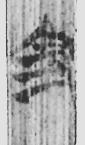命
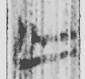亡
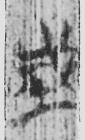成
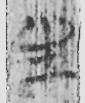生
